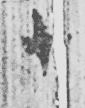十
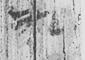九
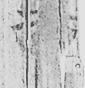百
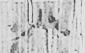八
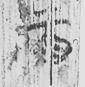百
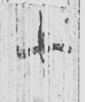七
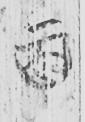百
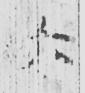六
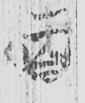百
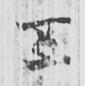五
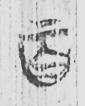百
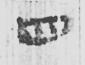四
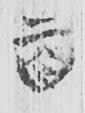百
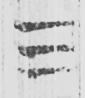三
